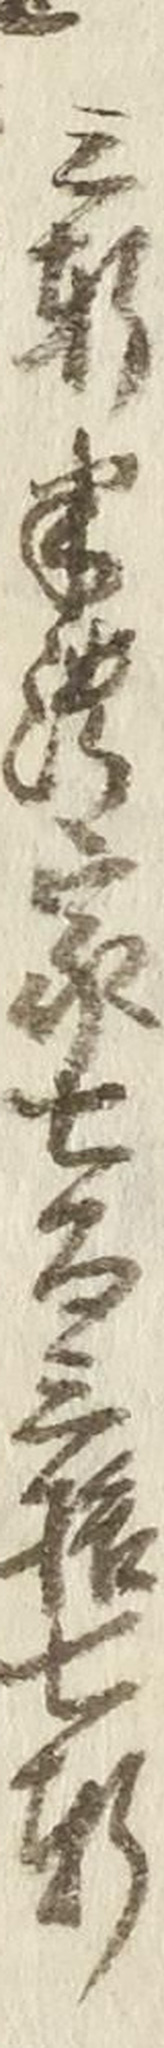三軒半潰家七百三拾七軒
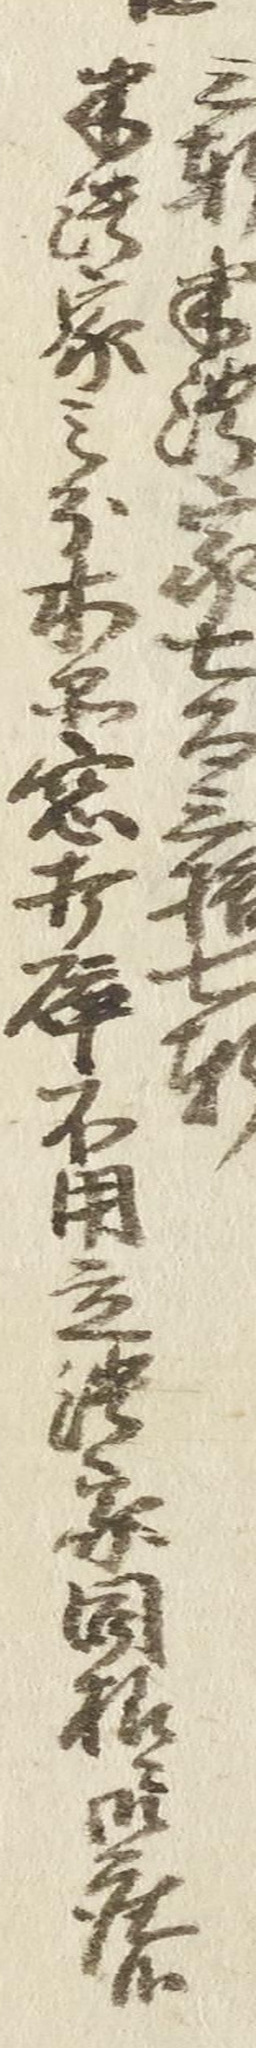但半潰家之分木品窓打砕不用立潰家同様ニ御座候
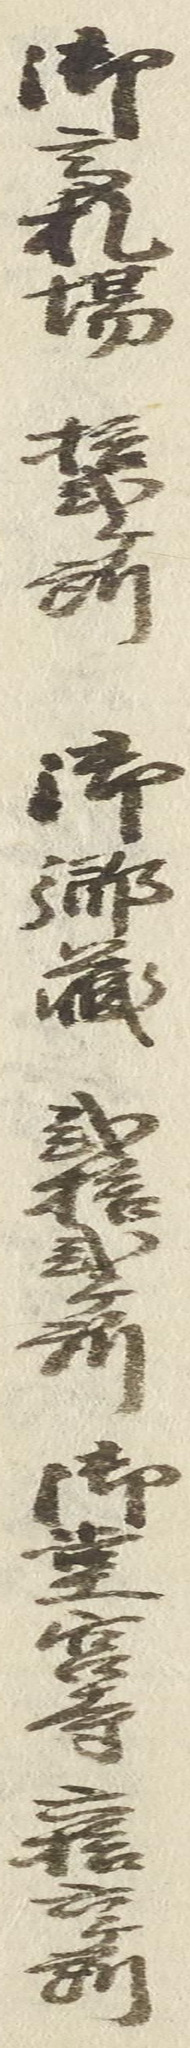御高札場拾弐ヶ所御郷蔵弐拾弐ヶ所御堂宮寺六拾六ヶ所
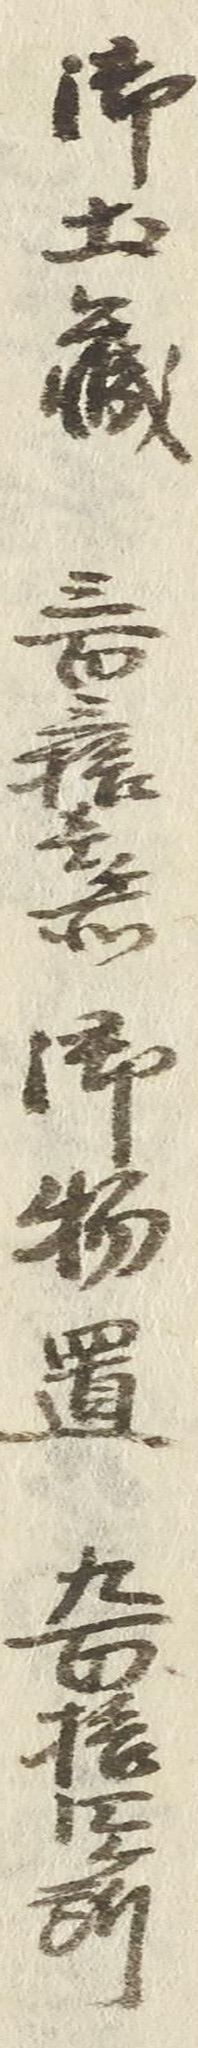御土蔵三百三拾壱ヶ所御物置九百拾四ヶ所
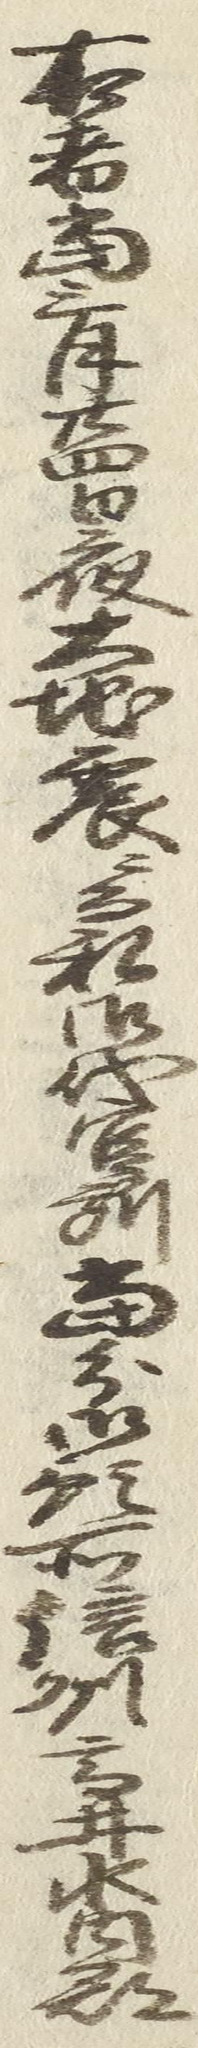右者当三月廿四日夜大地震ニ而私御代官所当分御預所信州高井水内郡
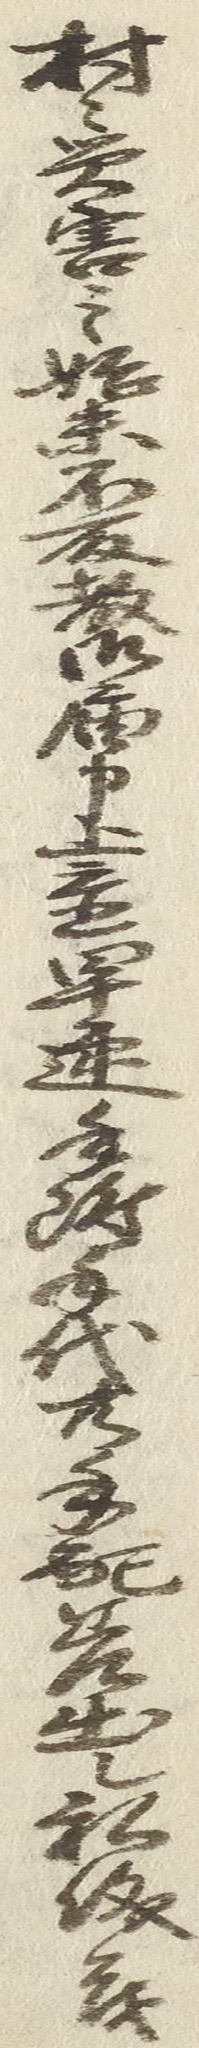村々災害之始末不取敢御届申上置早速手附手代共手配差出し私儀も
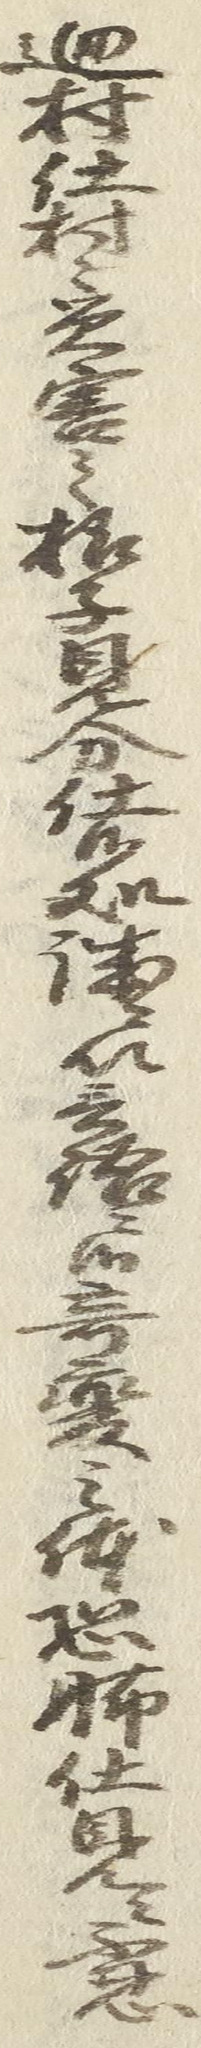廻村仕村々災害之様子見分仕候処誠ニ以言語ニ候奇変之体恐怖仕見ニ不忍
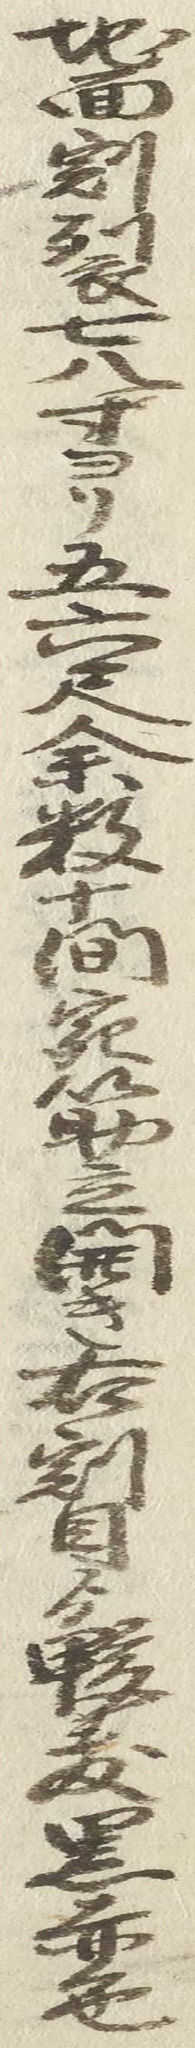地面割裂七八寸ヨリ五六尺余数十間宛筋立開き右割目ゟ夥敷黒赤色
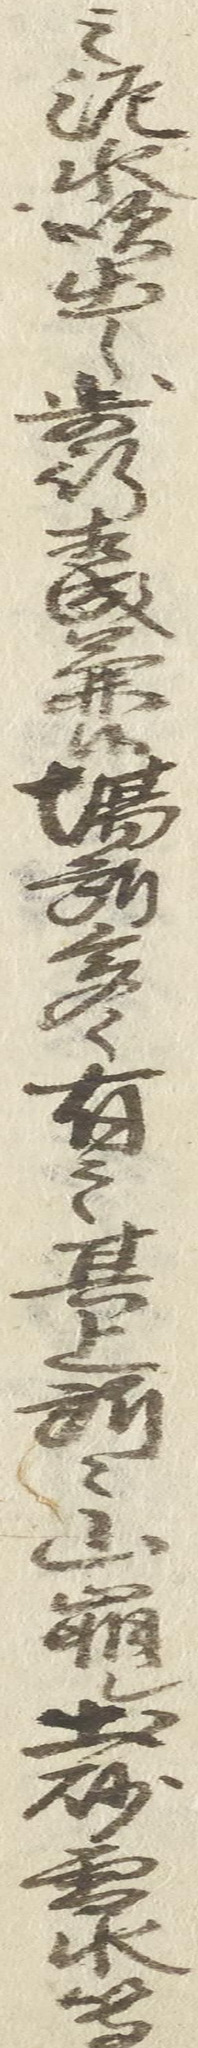之泥水吹出歩行相成兼候場所多く有之其上所々山崩レ土砂雪水等
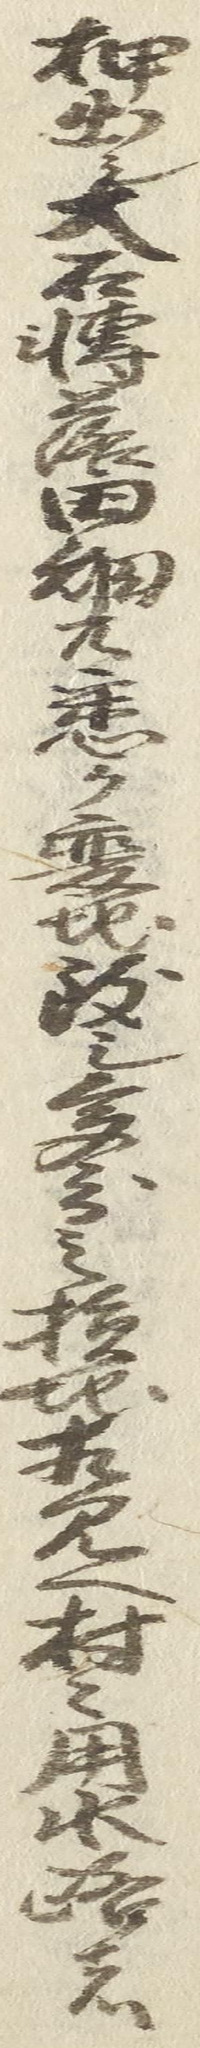押出シ大石転落田畑共悉ク変地致シ多分之損地相見へ村々用水路は
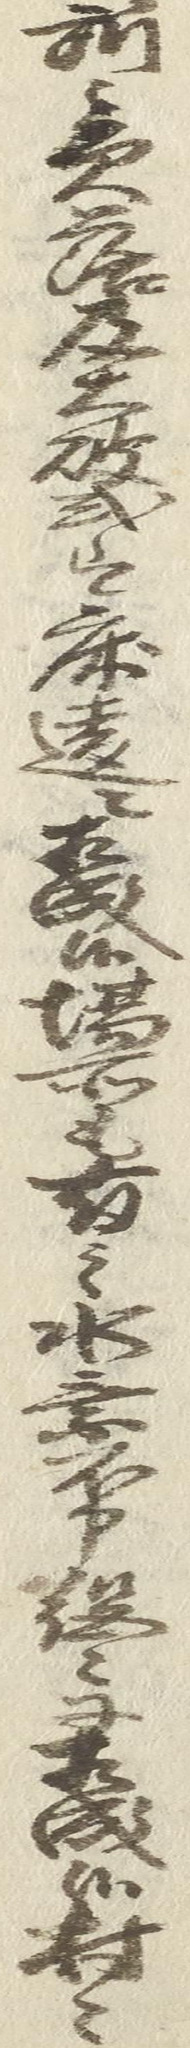所々欠落及大破或は床違ニ相成候場所も有之水乗不申絶々に相成候村々
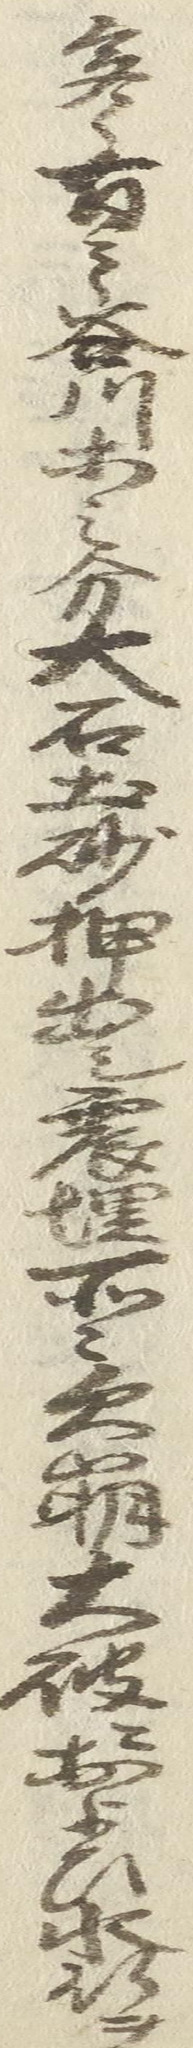多く有之谷川等之分大石土砂押出シ震埋所々欠崩大破ニおよひ水行ヲ

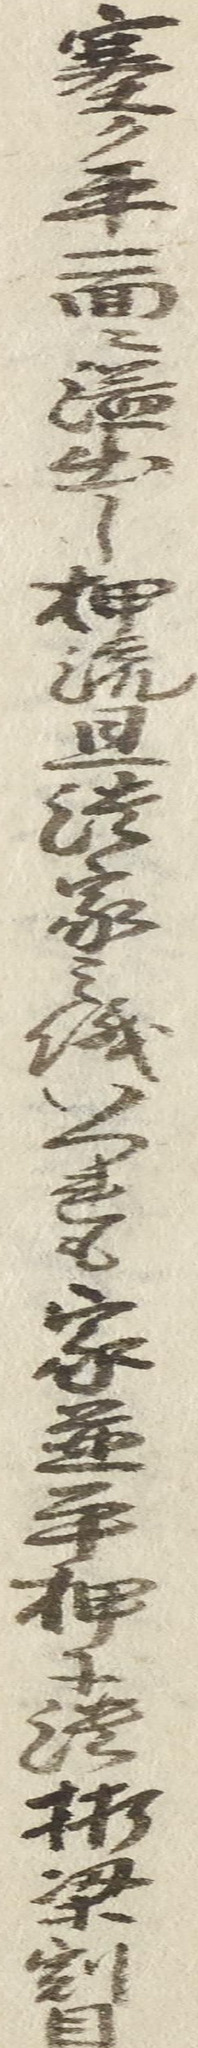塞ク平一面ニ溢出し押流且潰家之儀いつれも家並平押に潰桁梁割目
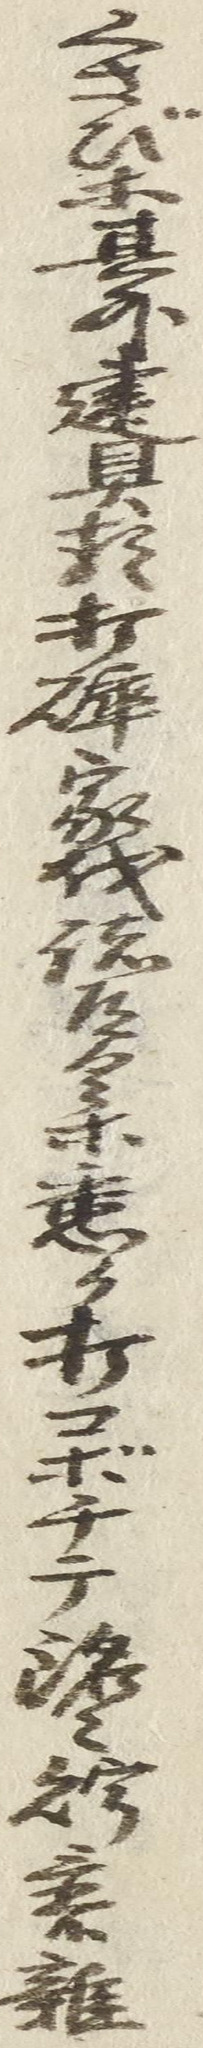くさび等其外建具類打砕家財諸道具等悉ク打コボチテ銘々貯置候雑
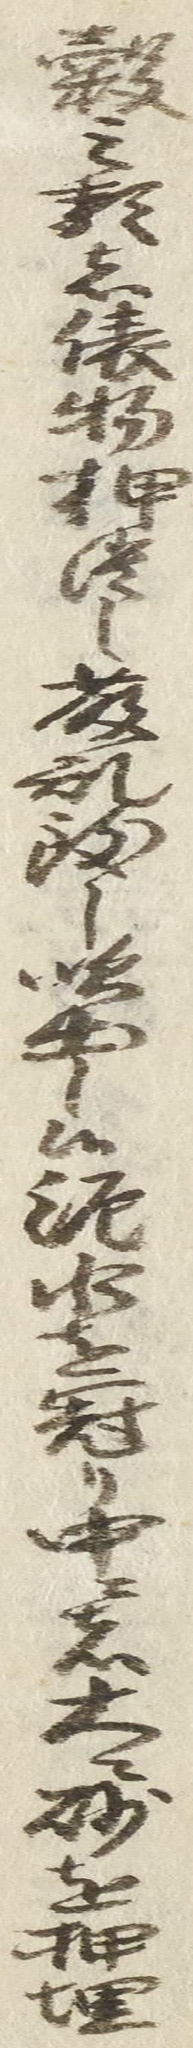穀之類は俵物押潰し散乱致し吹出し候泥水を冠り中ニは大ニ砂を押埋
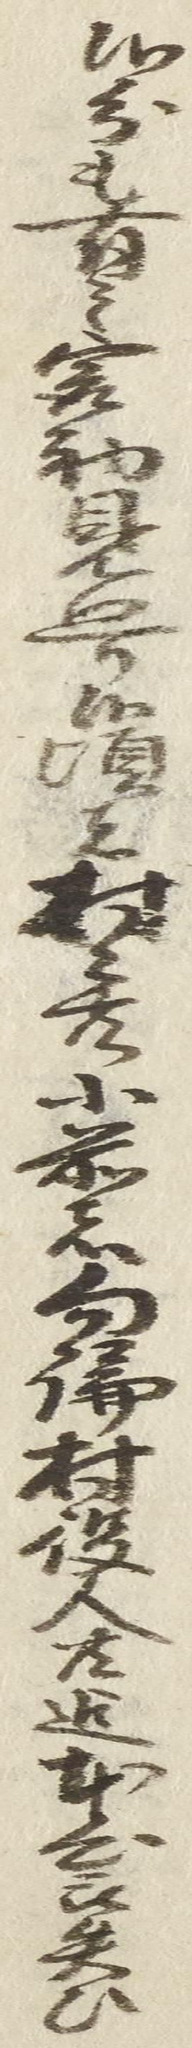候分も有之最初見廻り候頃は村々共小前は勿論村役人共迄本心被失ひ
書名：従往古地震御届書記誌之一
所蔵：東京大学地震研究所図書室 Earthquake Research Institute Library, The University of Tokyo, JAPAN
